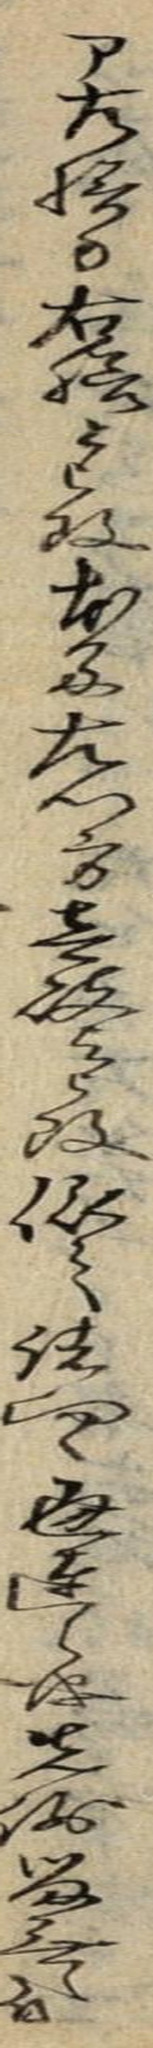部左膳方右膳に被改本多左門方壱岐と被改依之諸向へ通達之儀先例留無之候に付
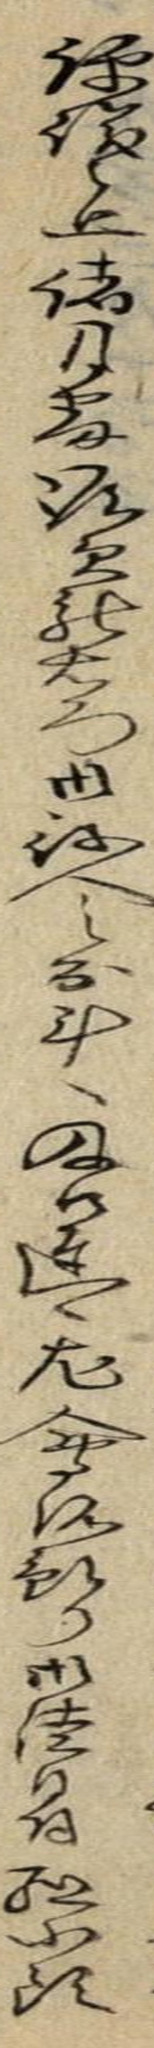評議之上詰月番渥美新右衛門御役人之分斗へ及御達候尤会所預り御徒目付組小頭
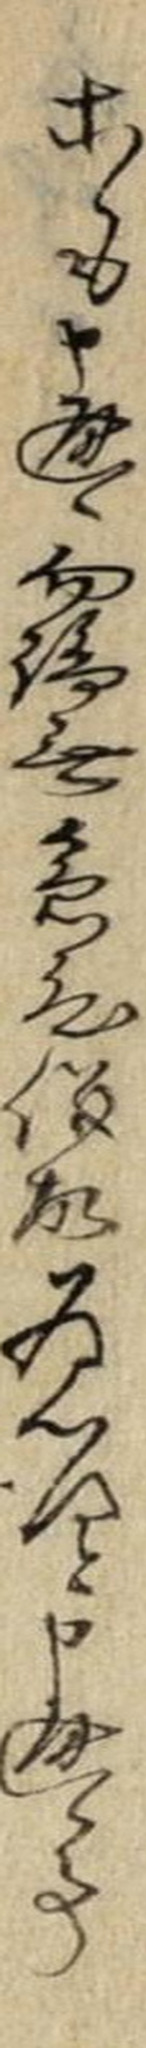等へも申通候勿論無急度儀故為心得と申通候事
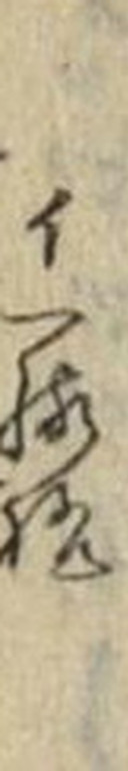イ一統格
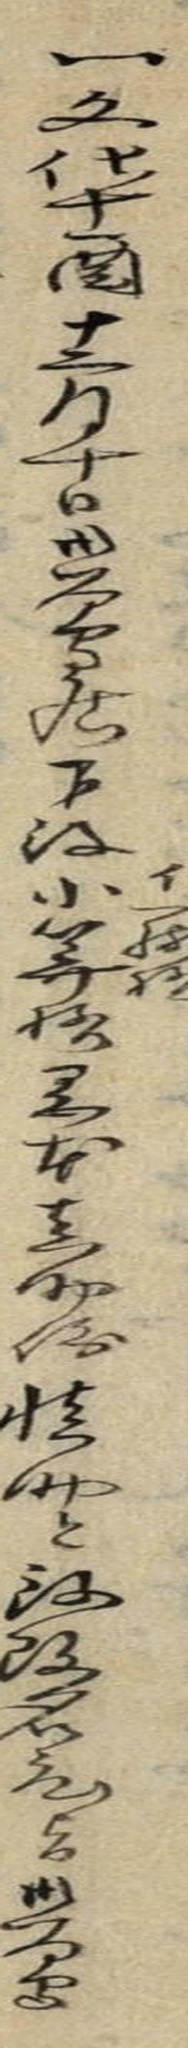一文化十酉十二月十日御留守居下役小算格岡本真助儀慎助と致改名度旨御留守
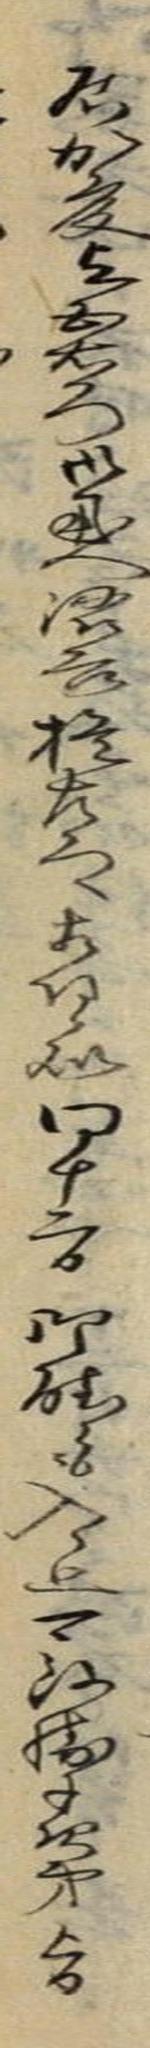居加藤与五右衛門御用人渋谷権左衛門へ相伺候処同十二日御聴にも入候上可致勝手次第旨
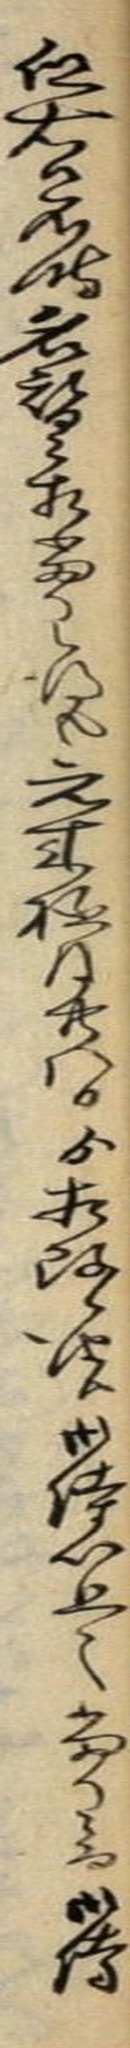但右は不時名替に相当り候得共元来極月廿八日ゟ相改候儀は御侍以上之当りに而御侍
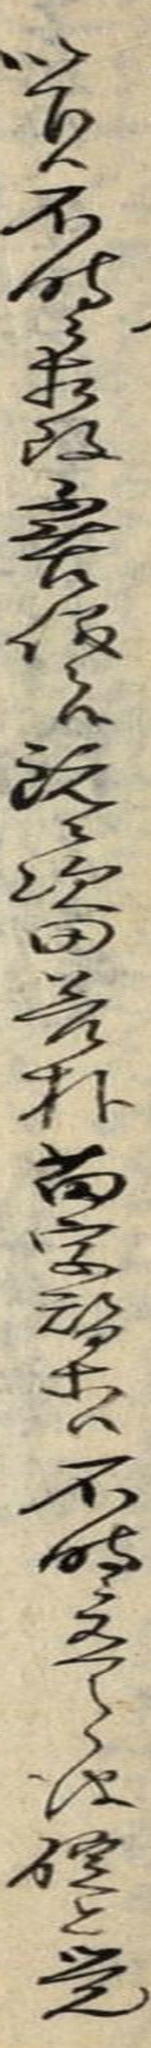以下は不時に相改不苦儀に候既に次田善朴苗字替等は不時に有之候儀聢と覚
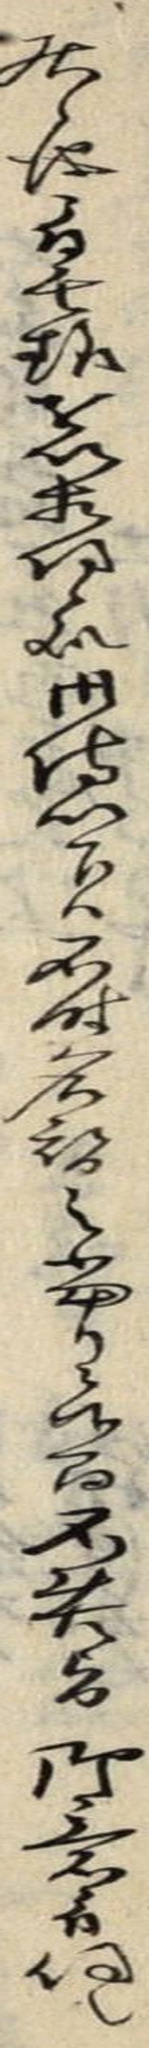居候儀に付其趣を以相伺候処御侍以下は不時名替之当りに候間不苦旨御意に付伺
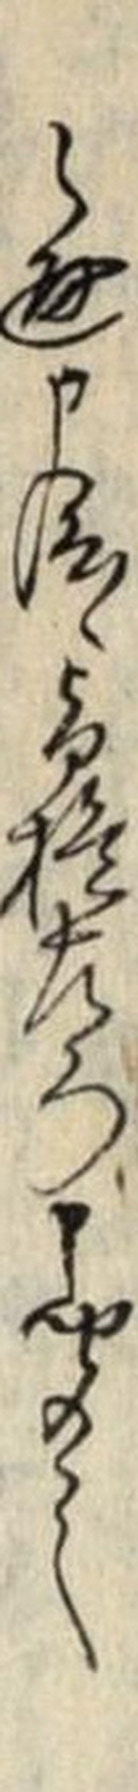之通申渡候旨権左衛門申聞之
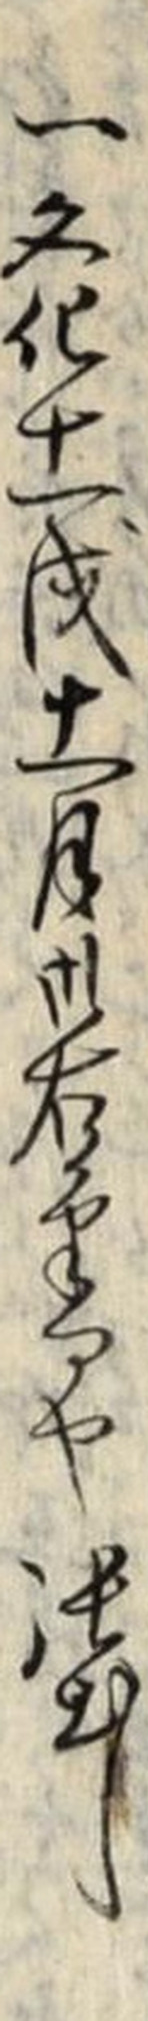一文化十一戌十一月御右筆部や張出し
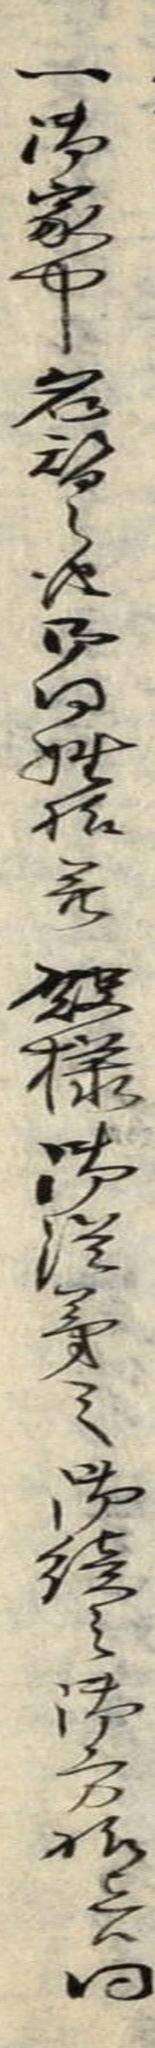一御家中名替之儀御同姓様并殿様御従弟之御続之御方様迄は同
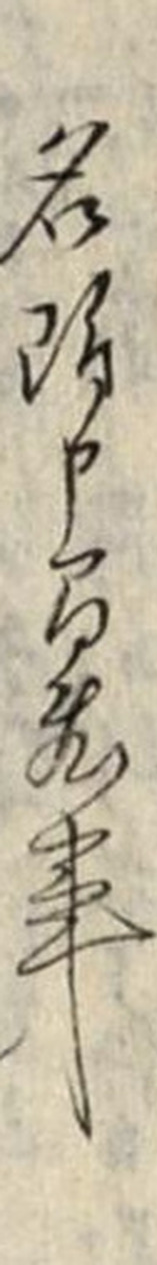名附申間敷事
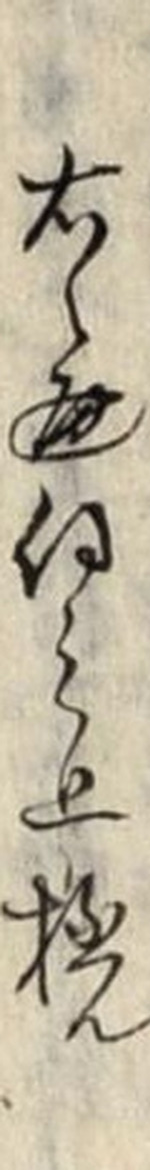右之通伺之上極る
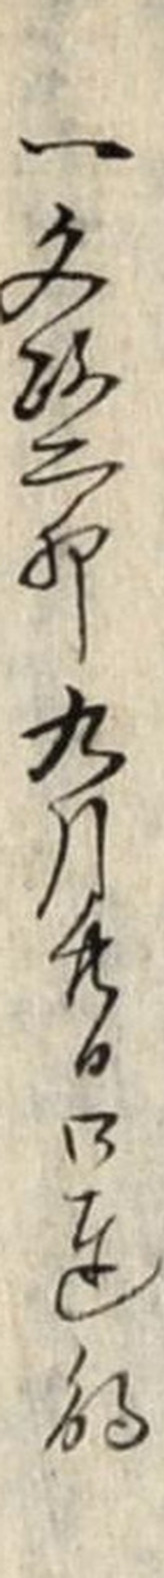一文政二卯九月廿日口達触
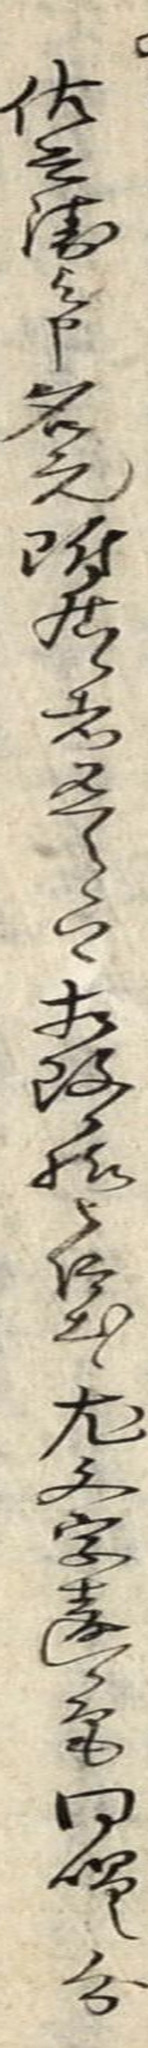佐兵衛と申名元附居候者有之候はゝ相改候様被仰出候尤文字違に而も同唱之分
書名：蒐輯之部
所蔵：福井県文書館 Fukui Prefectural Archives
